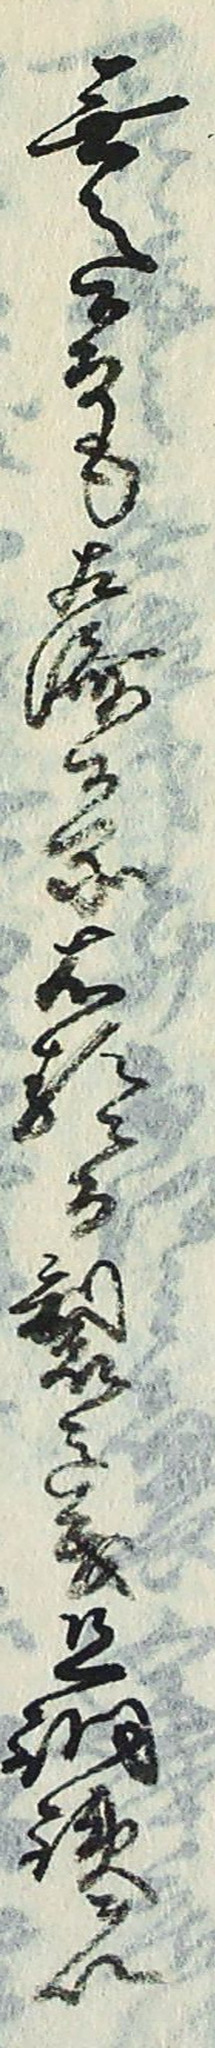無之候而も相済候品右類に而製之義且同鉄を以
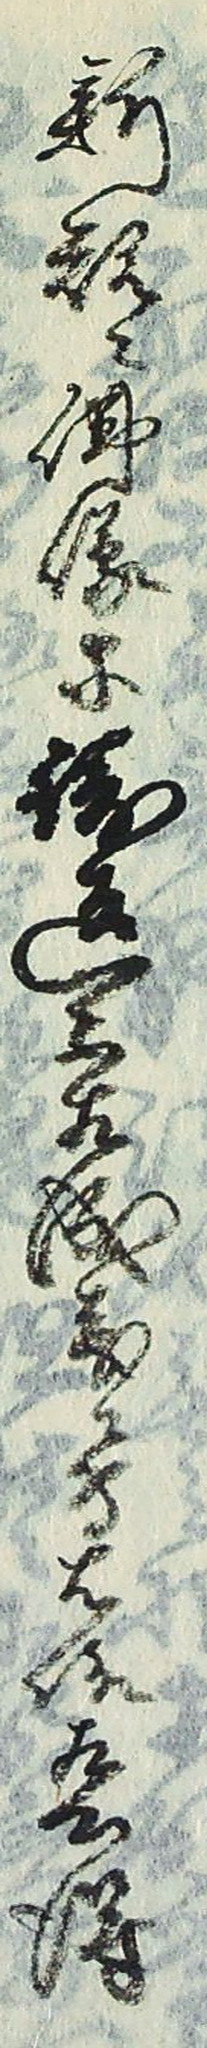新規に仏像等鋳造不相成義に付右様相心得
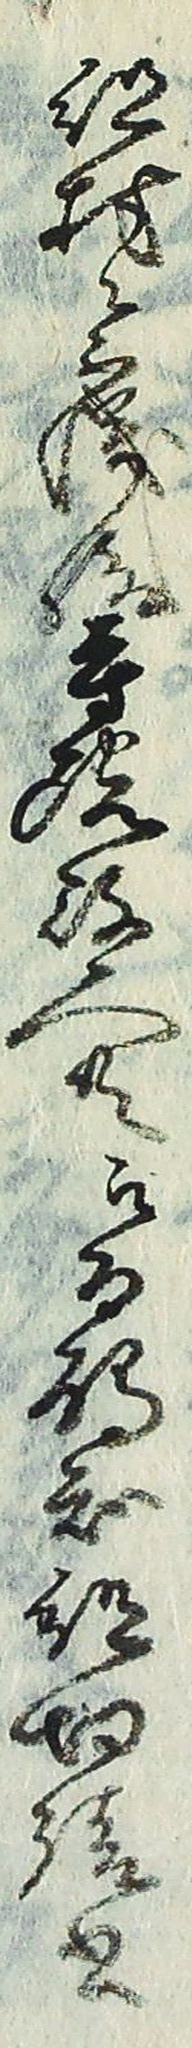組村々不洩様寺院役人共え為触知組切請書
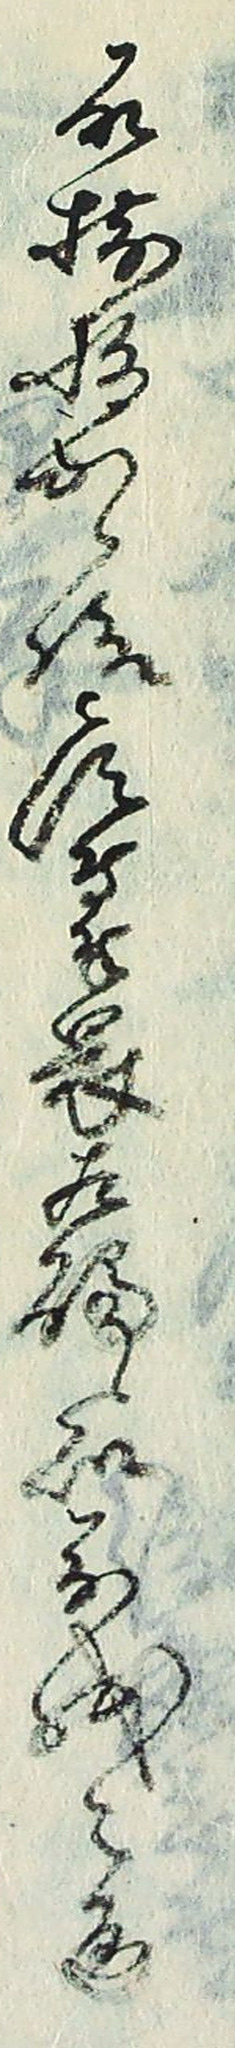取揃指出候様被仰付奉畏相触候処別紙之通
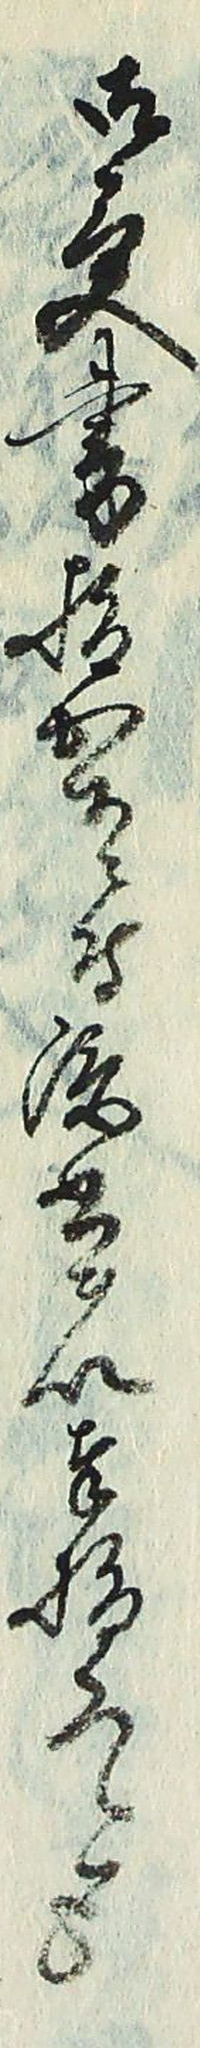御受書指出候に付添書を以奉指上候以上
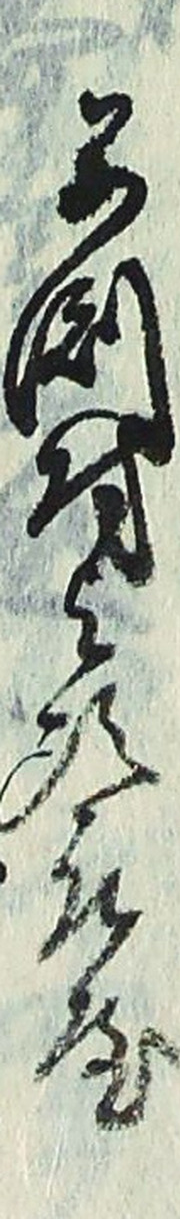早淵村与頭庄屋
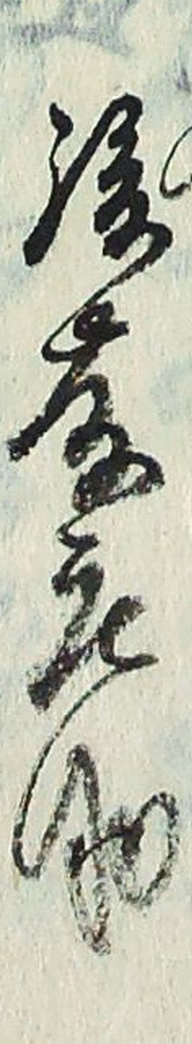後藤庄助
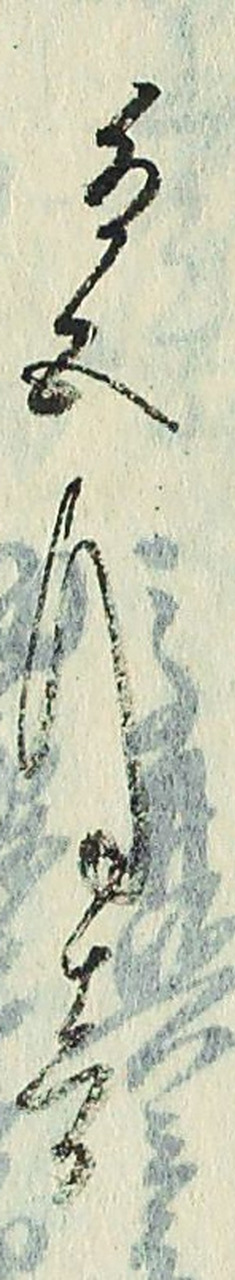卯五月十二日
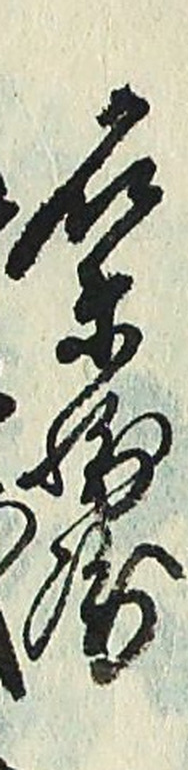名東勝浦
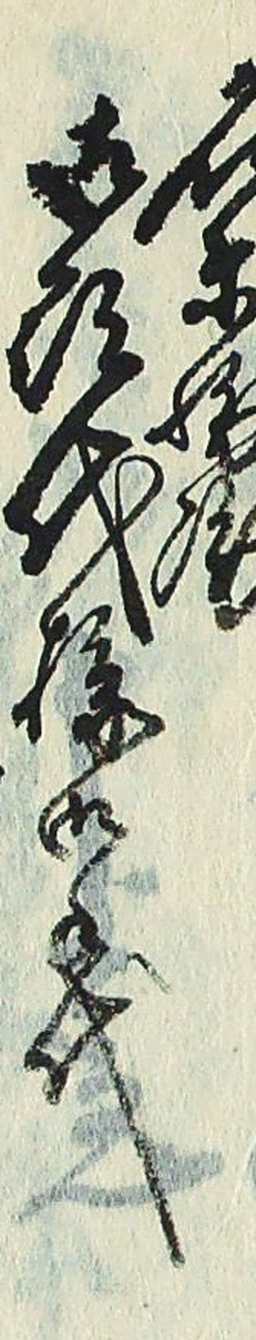御郡代様御手代
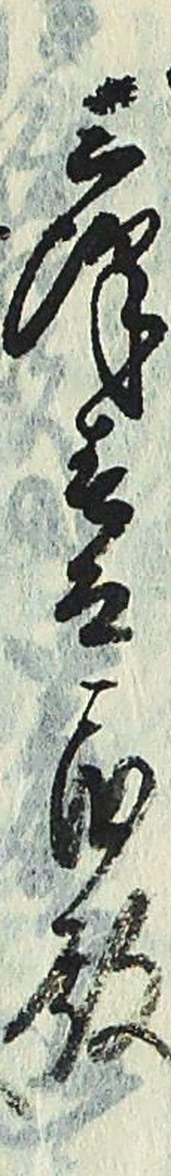三沢春太郎殿
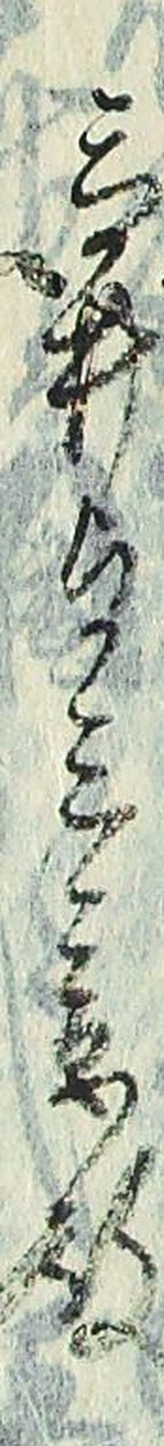高井与三兵衛殿
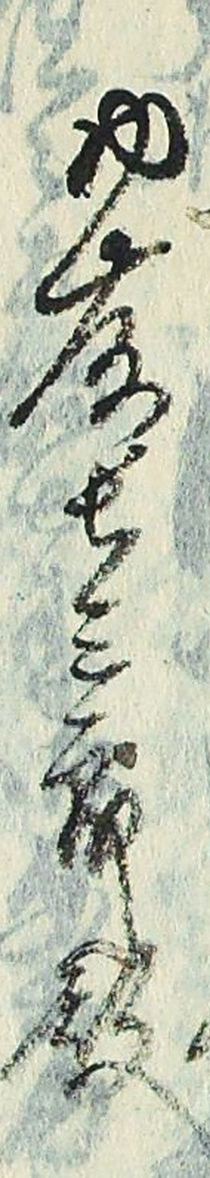内藤長三郎殿

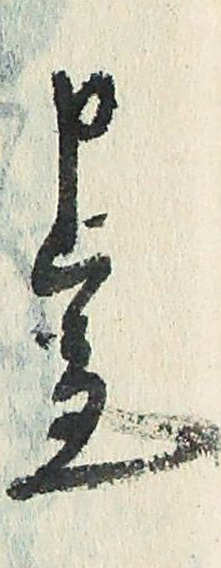申上覚
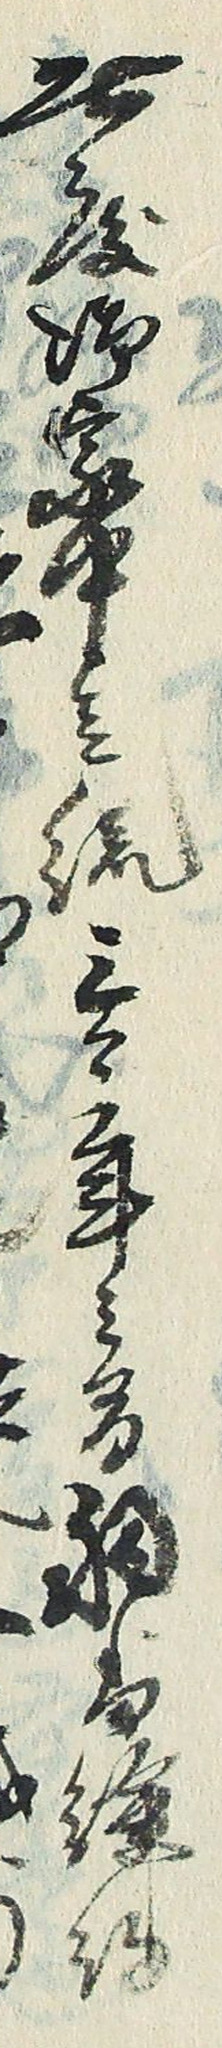此度御家中壱統三ケ年之間稠布倹約
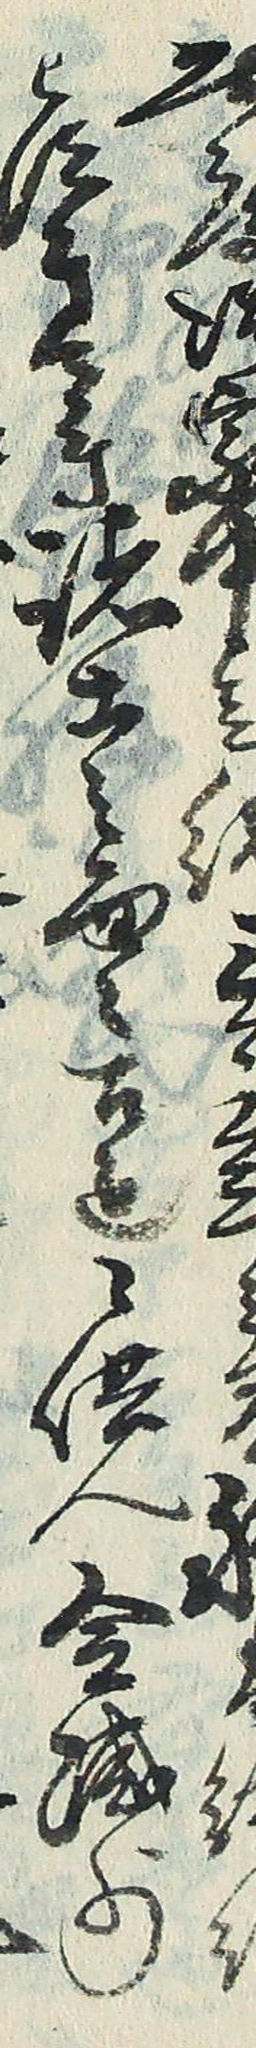被仰付候に付諸士之面々召連候供人令減少
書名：諸御用御□受書控
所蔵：鳴門教育大学 Naruto University of Education
